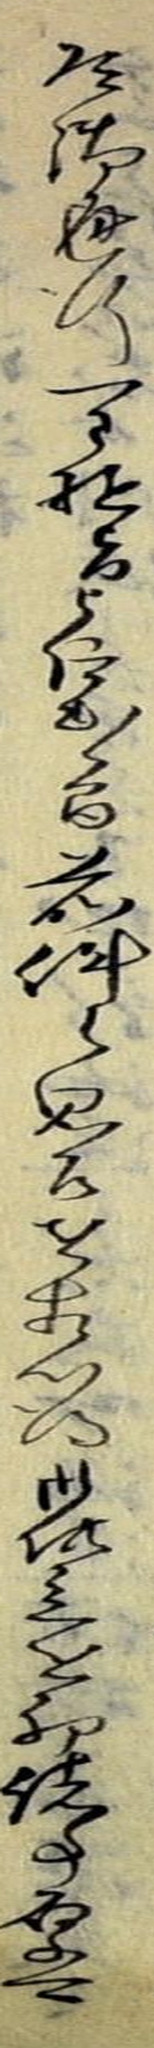道御通行可被遊旨被仰出候間前件之思召を相心得御供立を初諸事厚可
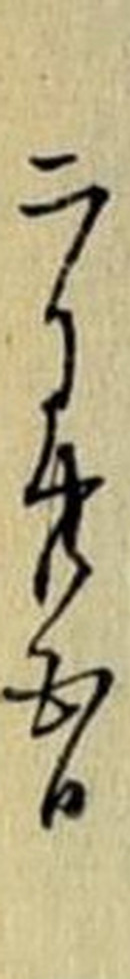二月廿五日
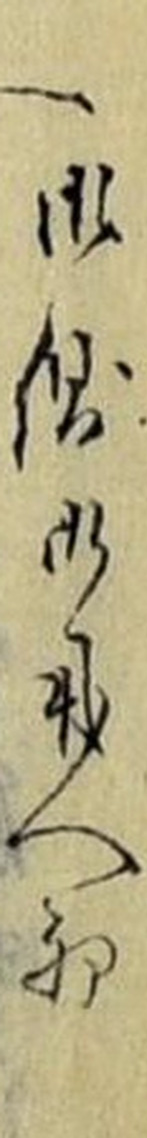御側御用人初
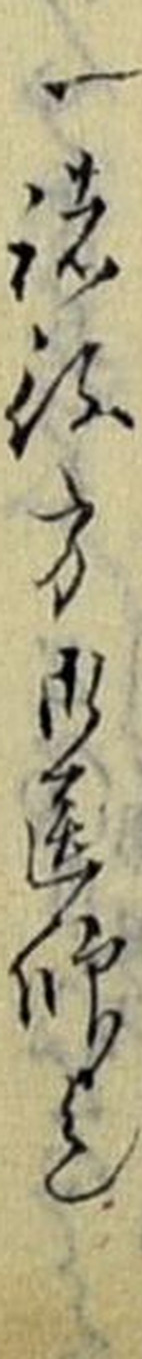諸役方御医師迄
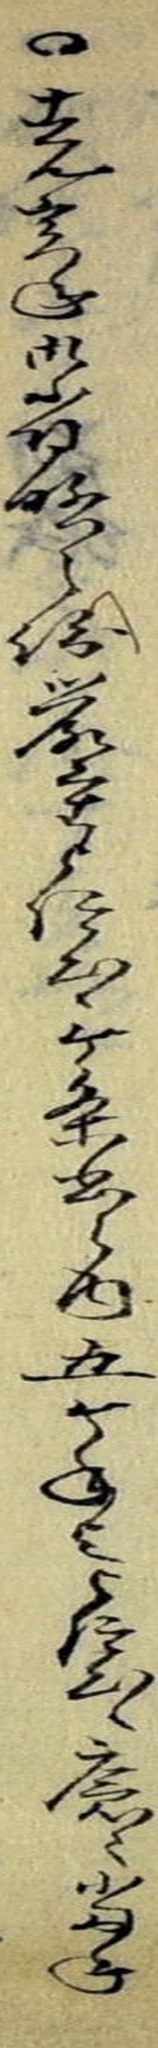○去ル寅年御省略之儀厳重被仰出候ヶ条之内五ヶ年と被仰出候廉々当年
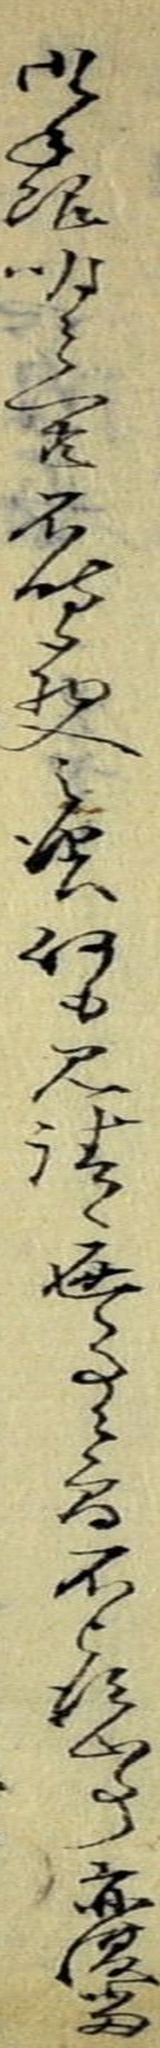御年限明に候へ共不時御物入之儀は何も見請候通之事に候間不被得止事亦復当
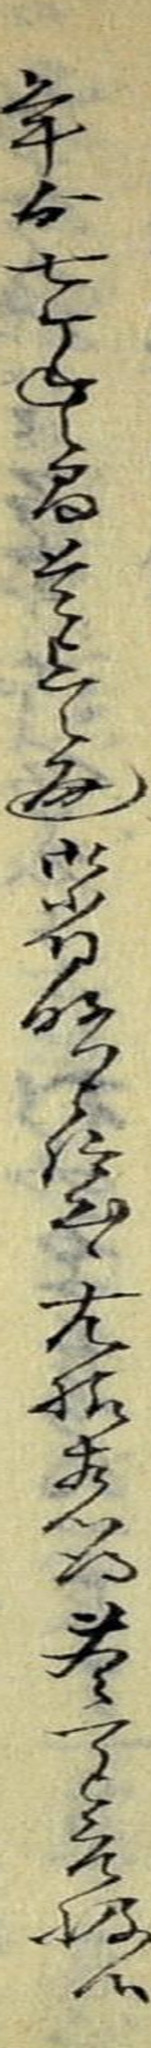年ゟ七ヶ年之間是迄之通御省略被仰出候左様相心得夫々可被取扱候
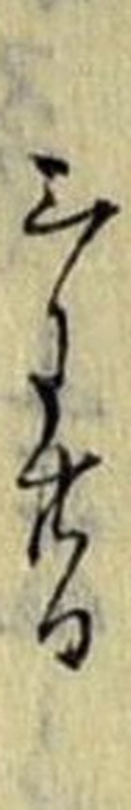三月廿日
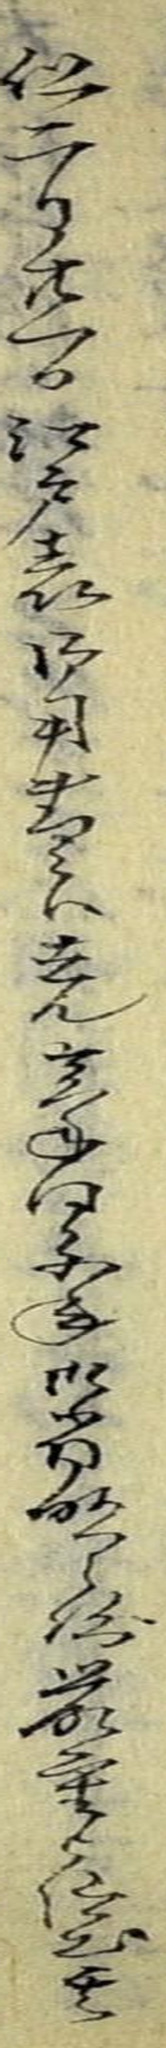但二月廿一日江戸表御用番には去ル亥年同子年御省略之儀厳重被仰出其
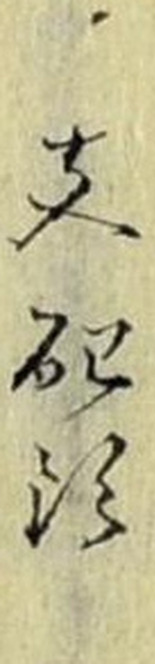支配頭
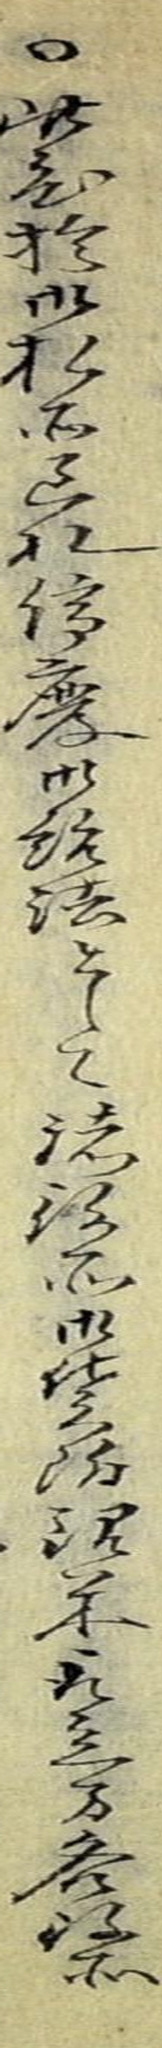○此度於御札所過札停廃御趣法として諸役所御貸附銀米取立方各役所
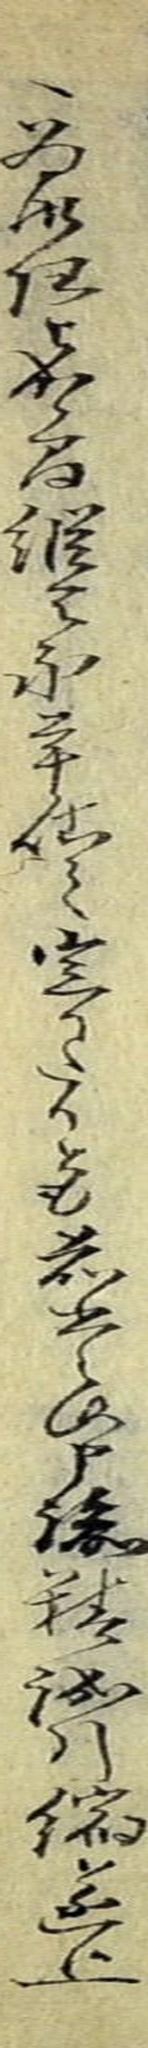へ為御任被成候間従令永年賦之定たりとも前書之趣申談精誠引縮遂上
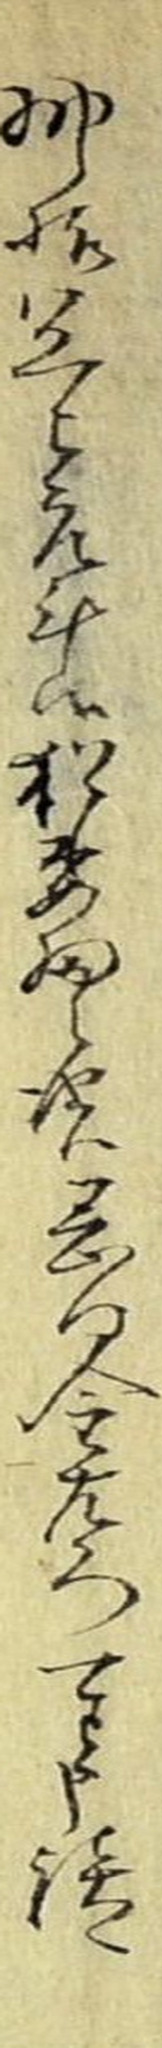納候様宜被取斗候猶委細之儀は岡田金左衛門可被申談候
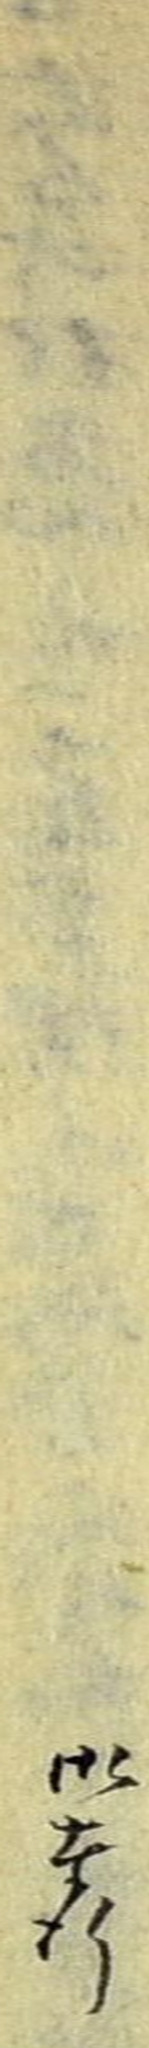御奉行
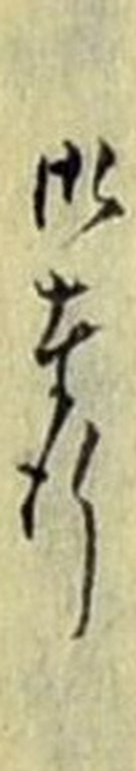御奉行
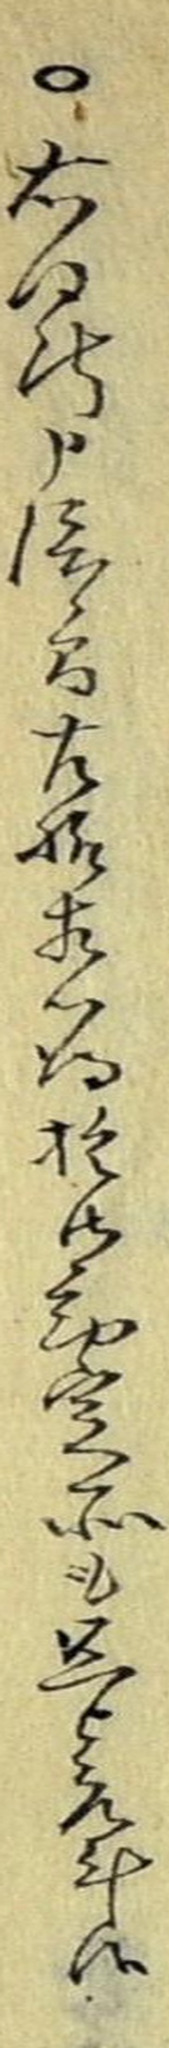○右同断申渡候間左様相心得於御勘定所も宜被取斗候
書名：命令之部 六
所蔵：福井県文書館 Fukui Prefectural Archives
